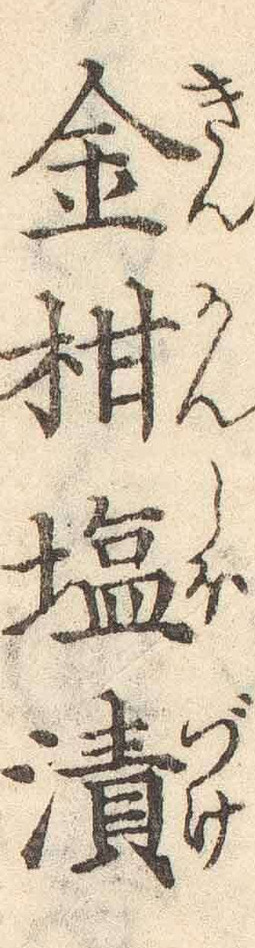金柑塩漬
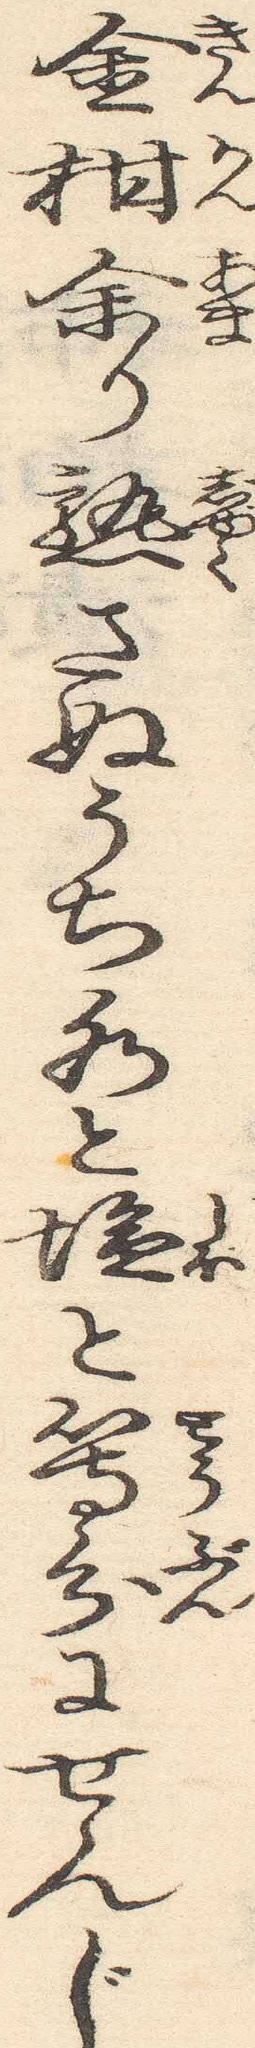金柑余り熟さぬうち水と塩と等分にせんじ
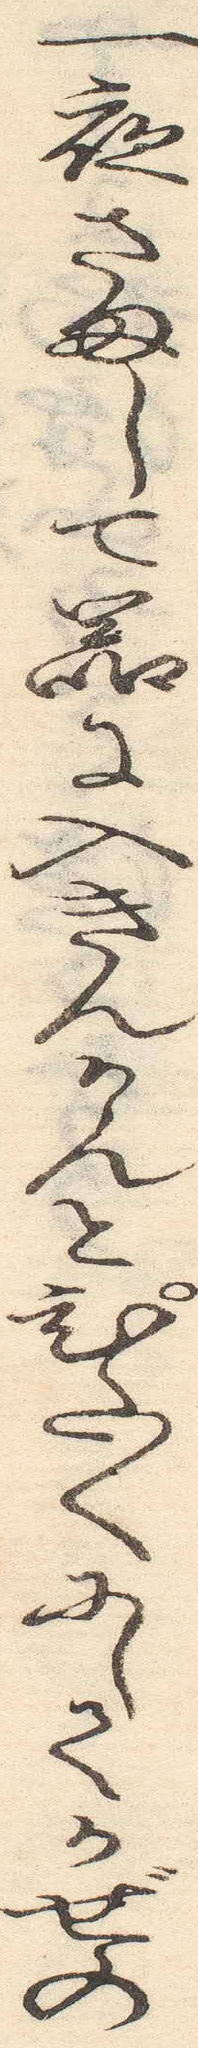一夜さまして器に入きんかんとぴた〳〵にしてかぜの
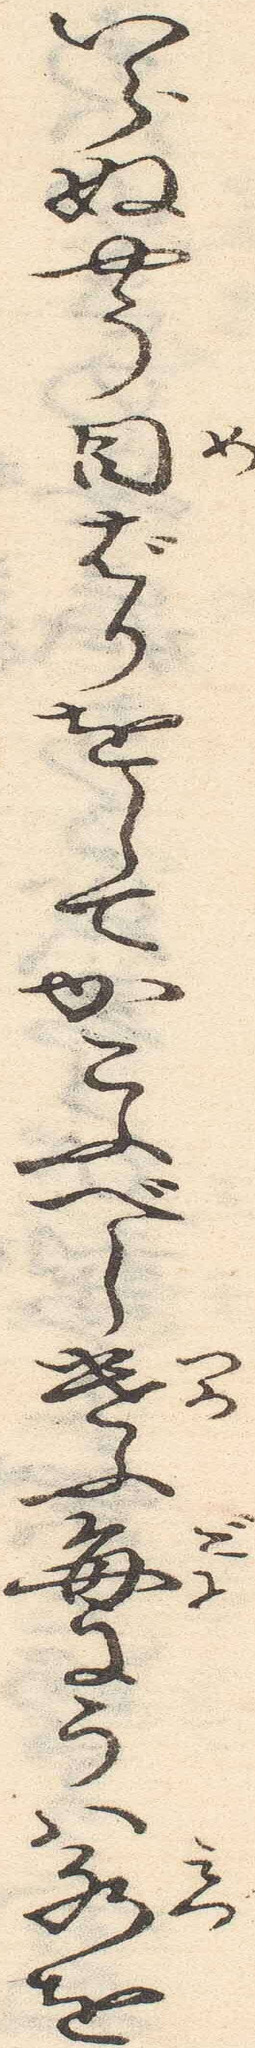いらぬやう目ばりをしてかこふべし遣ふ毎にうは水を
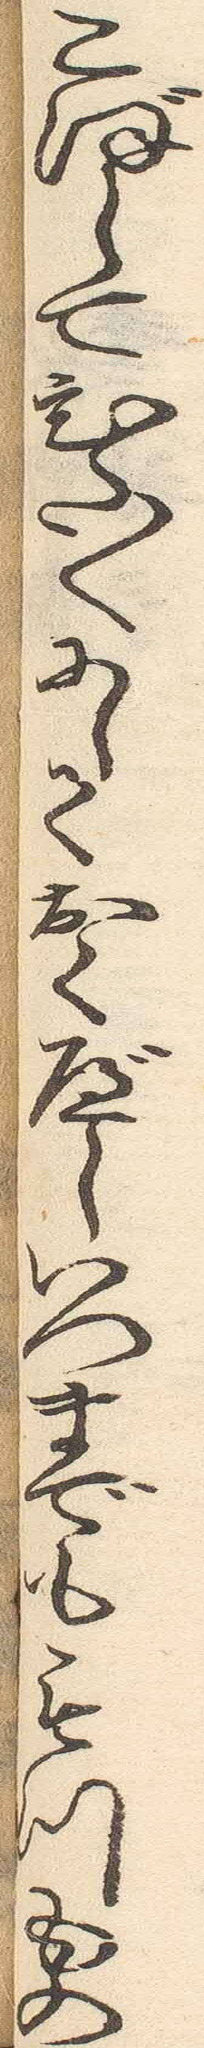こぼしてひた〳〵にしてべしいつまでももつもの
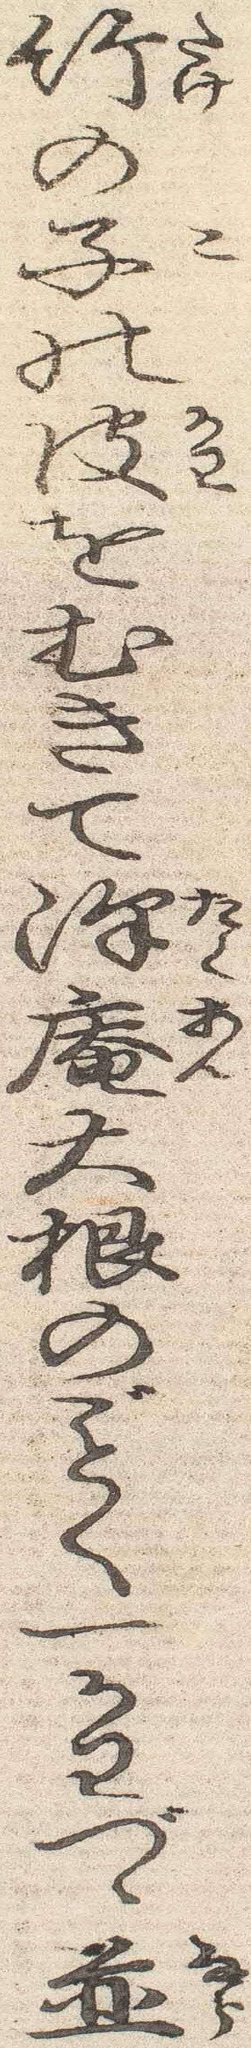竹の子の皮をむきて沢庵大根のごとく一かわづゝ並
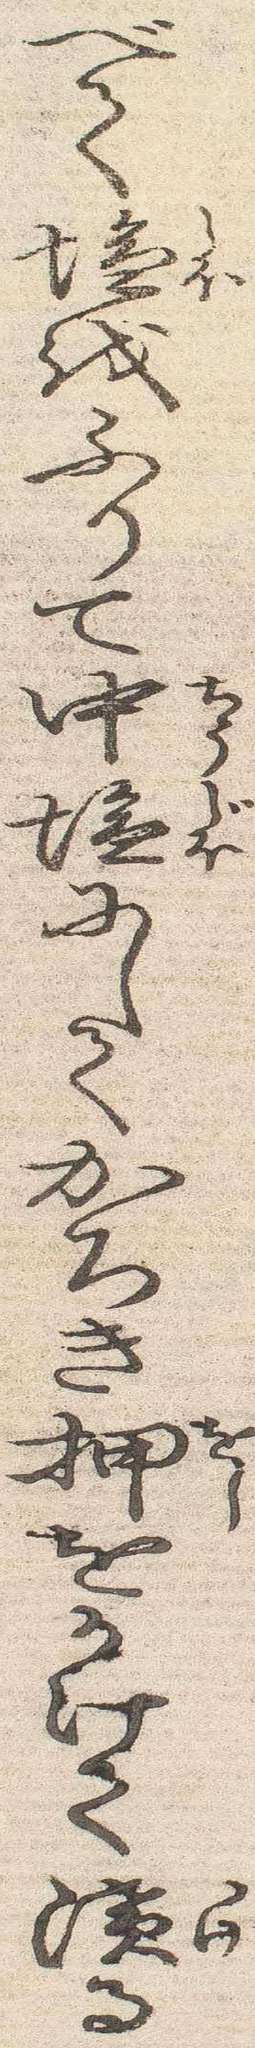べて塩をふりて中塩にしてかろき押をかけて漬る
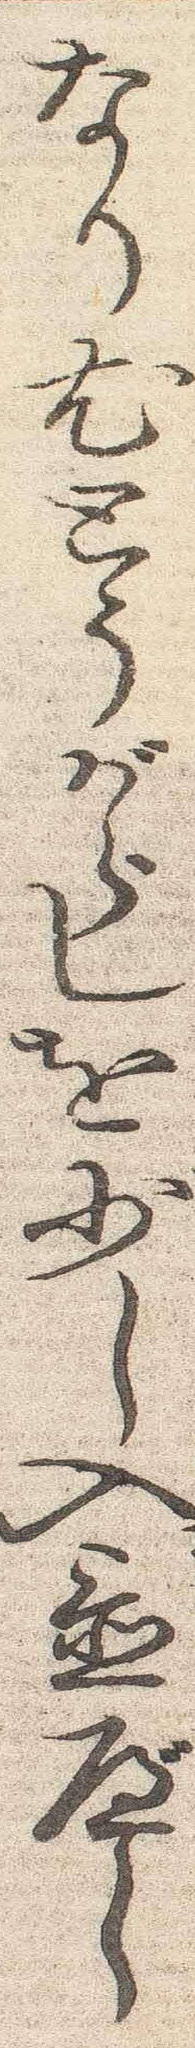なり尤とうがらしを少し入置べし
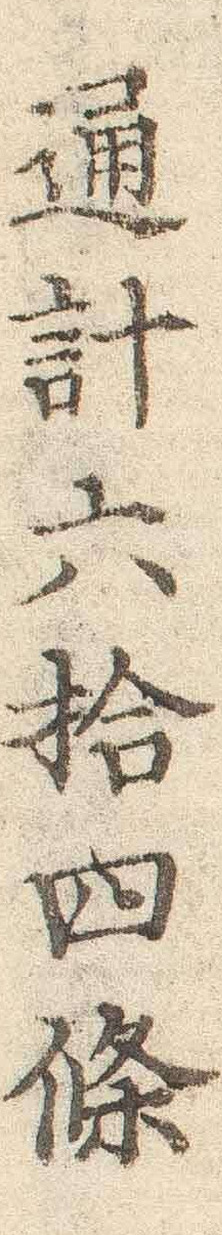通計六拾卯四条

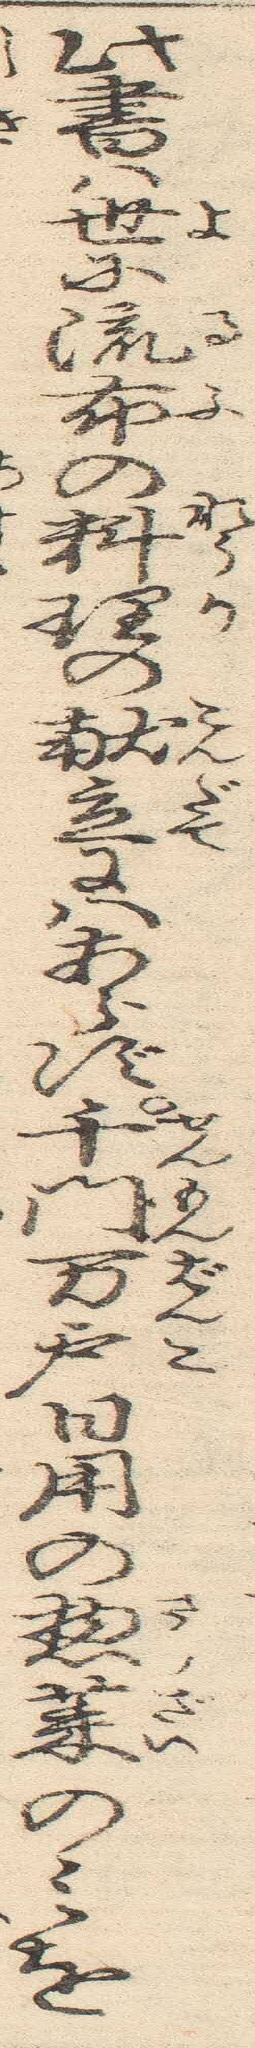此書は世に流布の料理の献立にはあらず。千門万戸日用の総菜のみを
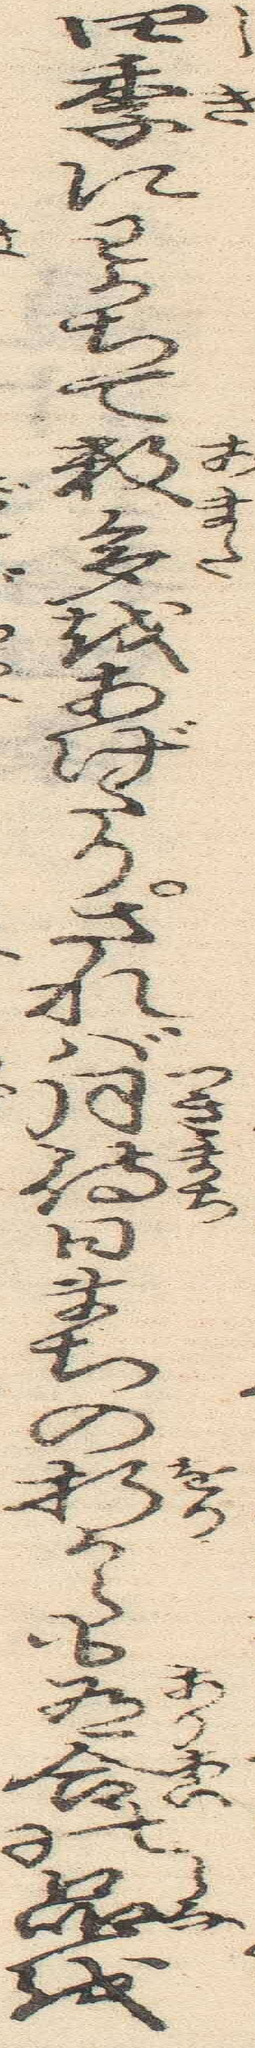四季にわかちて数多をあげたり。されば月待日まちの折からも有合の品を
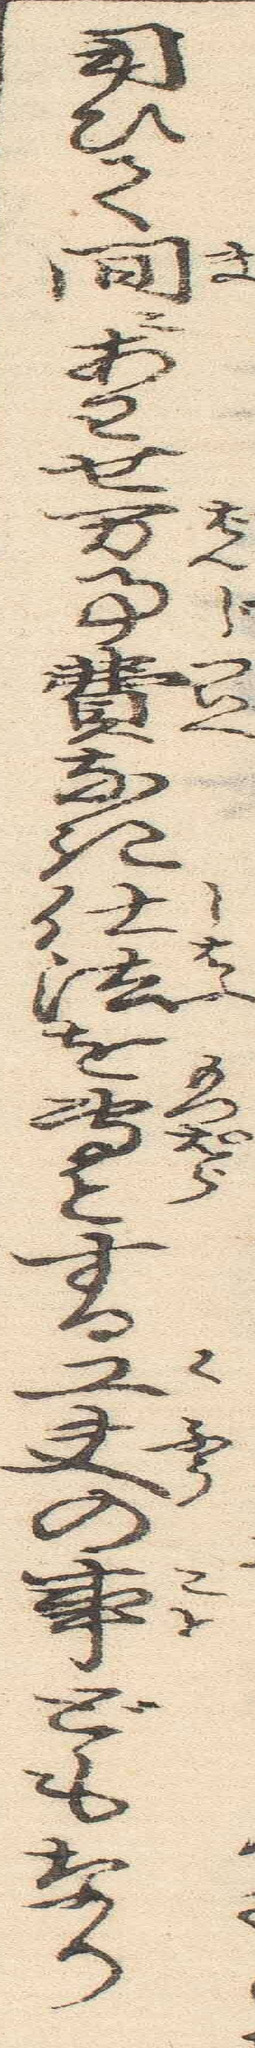用ひて間にあわせ万事費なき仕法を専とする工夫の事どもなり
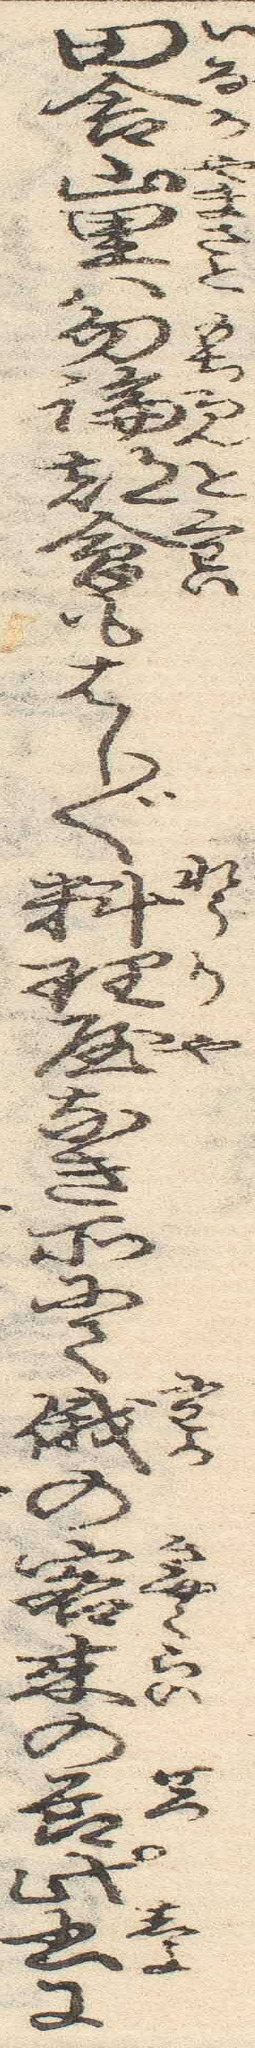田舎山里は勿論都会もはし〴〵料理屋なき所にて俄の客来の節。この書に
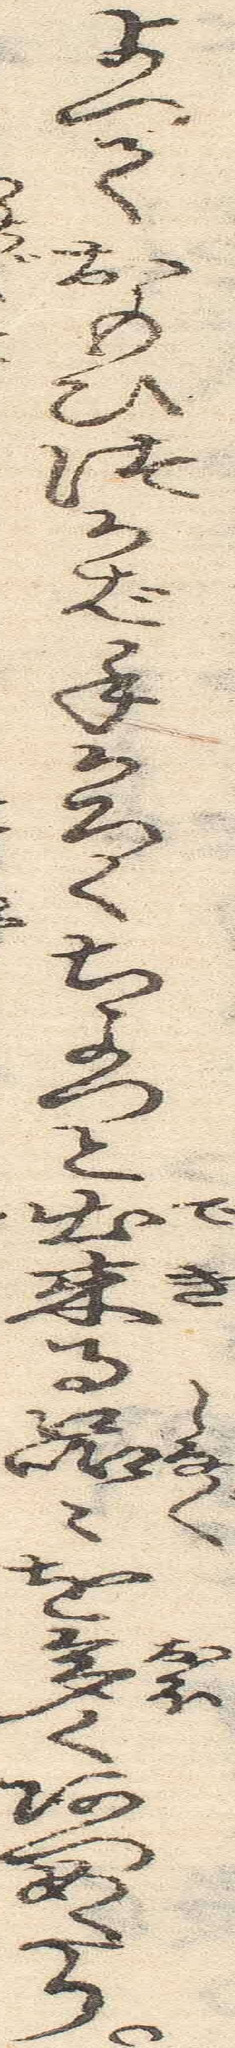よつておもひつかば手かろくちよつと出来る品々を多くあつめたり。
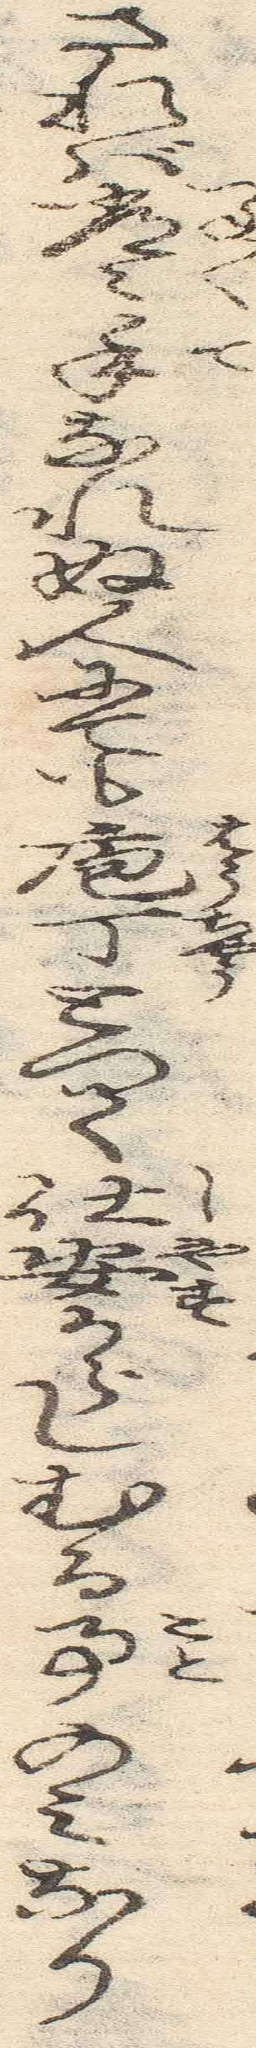されば常々手なれぬ人にても包丁とつて仕安からしむる事のみなり
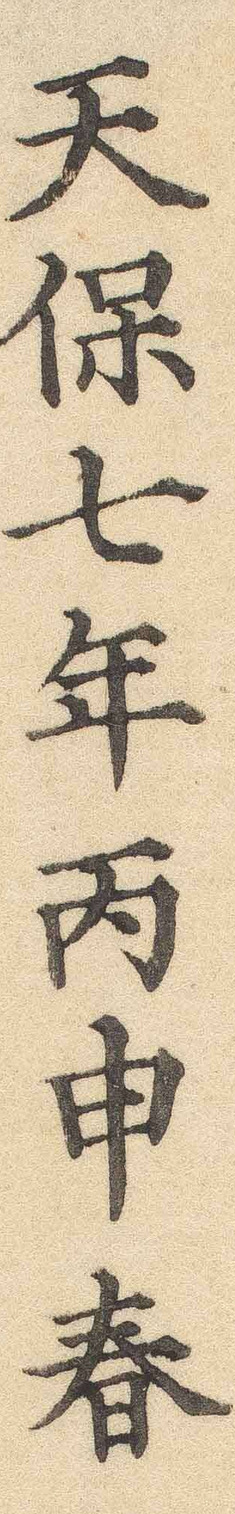天保七年丙申春
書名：四季漬物塩嘉言
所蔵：東京学芸大学附属図書館 国文学研究資料館
